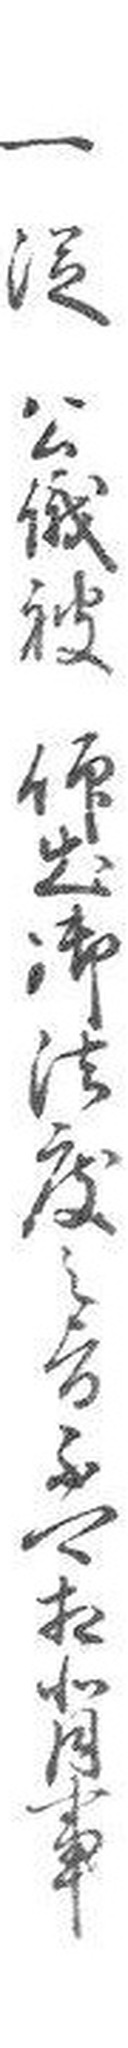一従公儀被仰出御法度之旨不可相背事
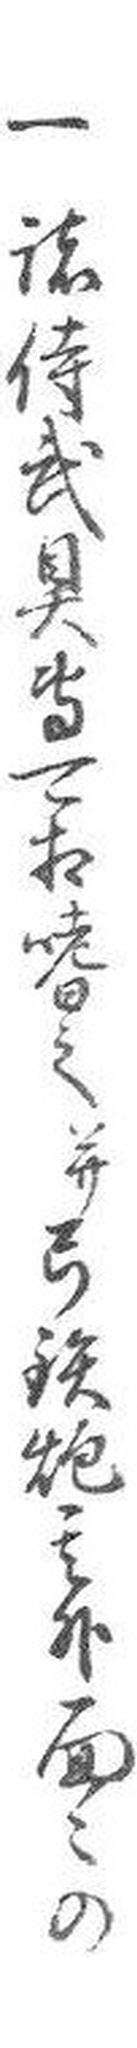一諸侍武具専可相嗜之并弓鉄砲其外面々の
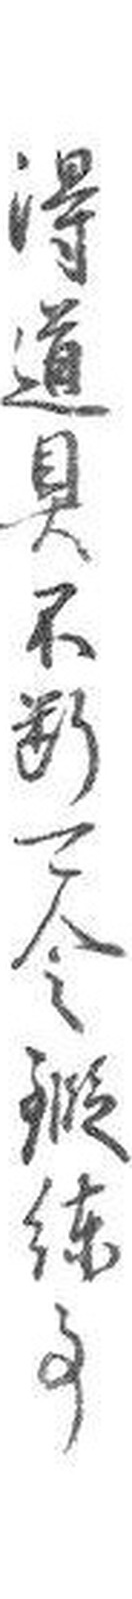得道具不断可令鍛錬事
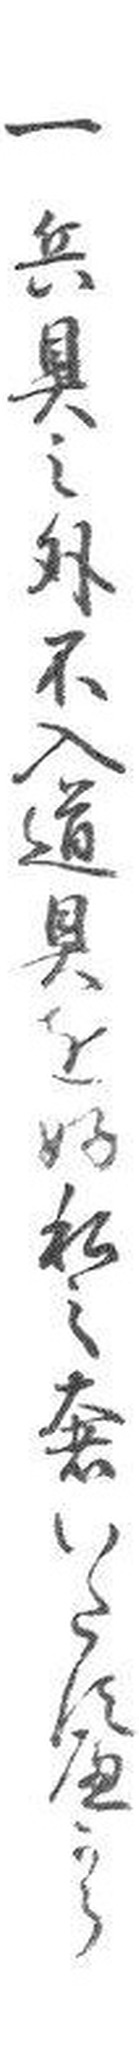一兵具之外不入道具を好私之奢いたすべから
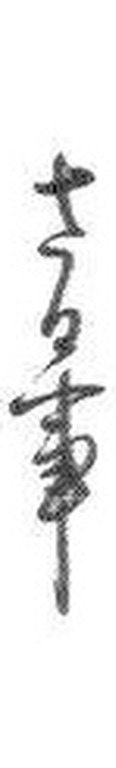さる事
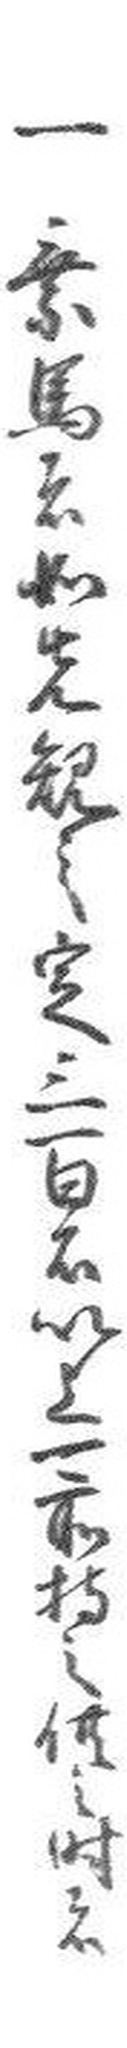一乗馬者如先規之定三百石以上可所持之侍之時者
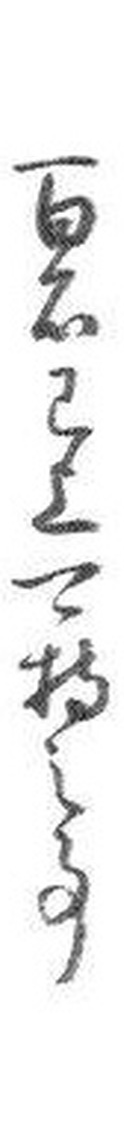百石已上可持之事
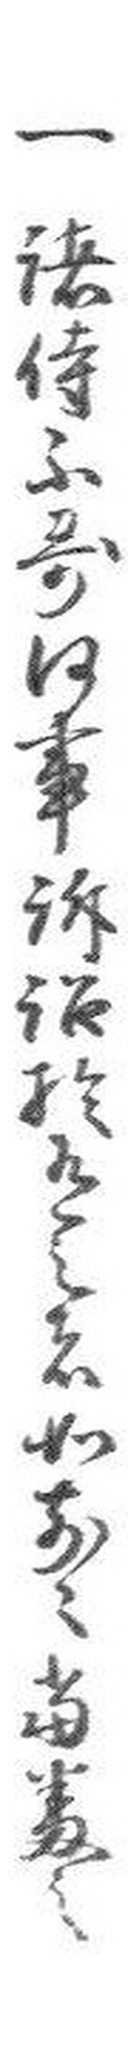一諸侍不寄何事訴訟於有之者如前々当番之
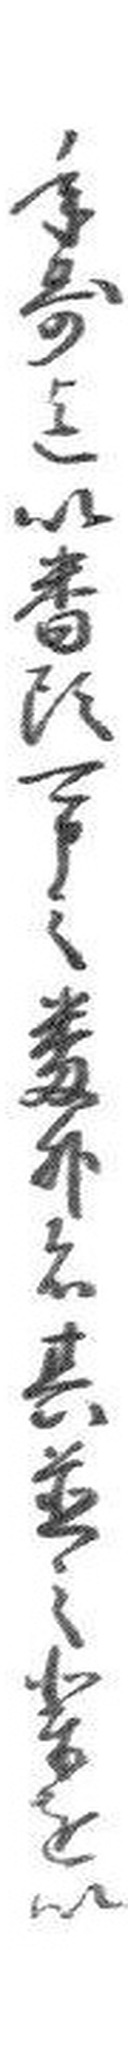年寄迄以番頭可申之番外者其並之輩を以
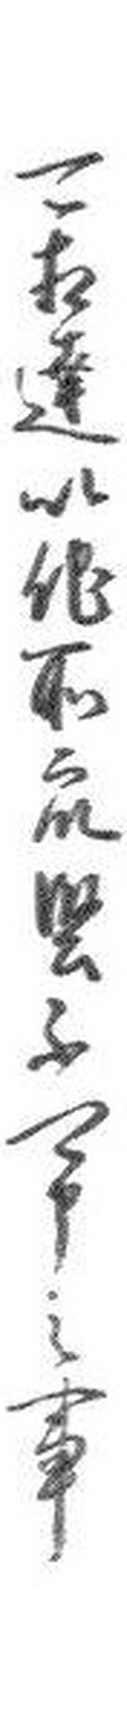可相達以作所衆堅不可申之事
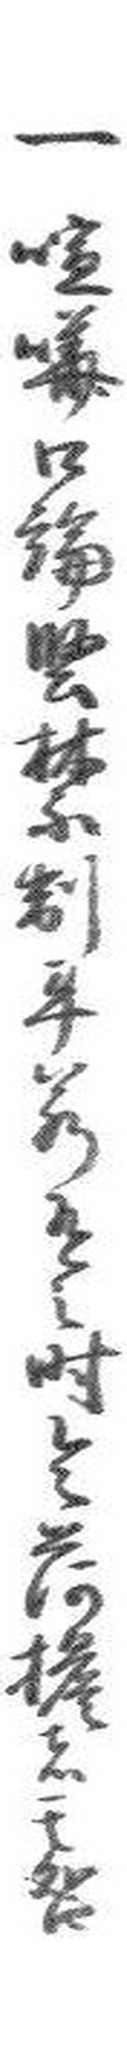一喧嘩口論堅禁制畢若有之時令荷担者其咎
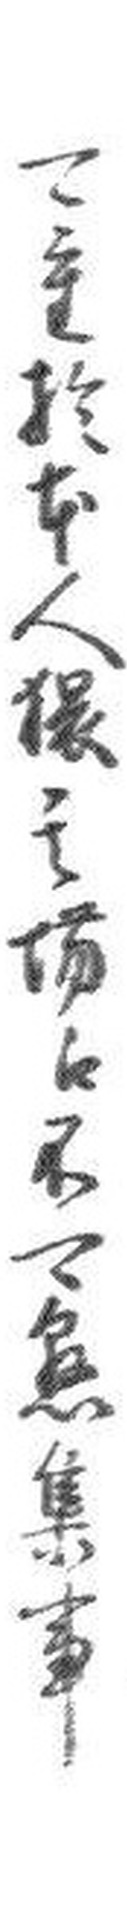可重於本人猥其場江不可懸集事
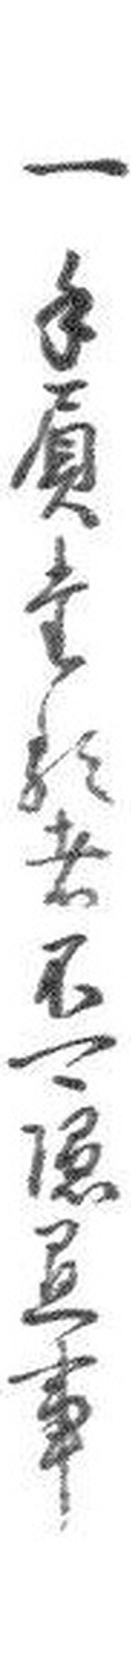一手負党たる者不可隠置事
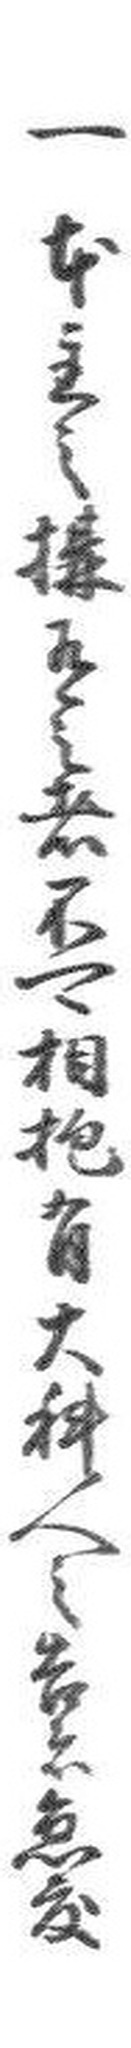一本主之構有之者不相抱有大科人之告者急度
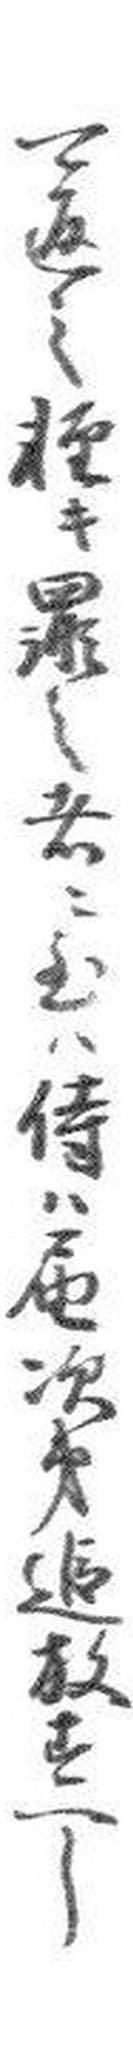可返之軽キ罪之者ニ至ㇵ侍ㇵ届次第追放すべし

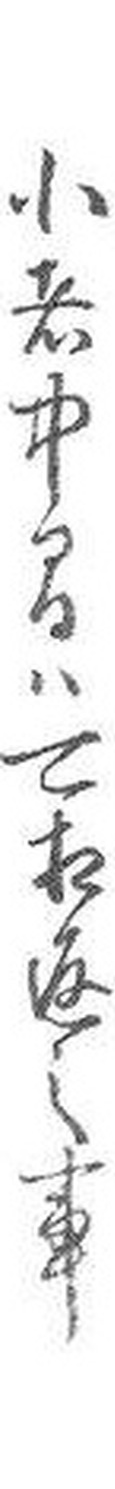小者中間ㇵ可相返之事
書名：家譜 五 光通公 従寛永十三年到万治二年
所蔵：福井県文書館 Fukui Prefectural Archives
